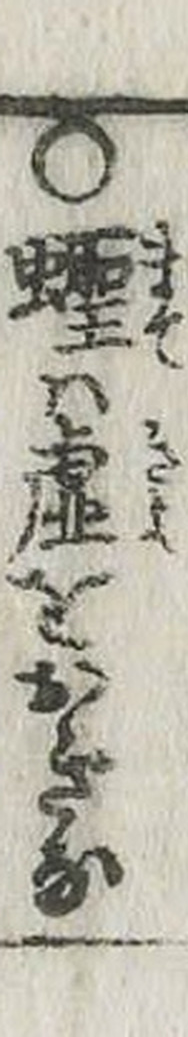○蟶は虚をおぎな
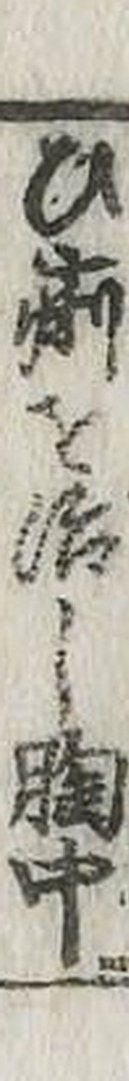ひ痢を治し胸中
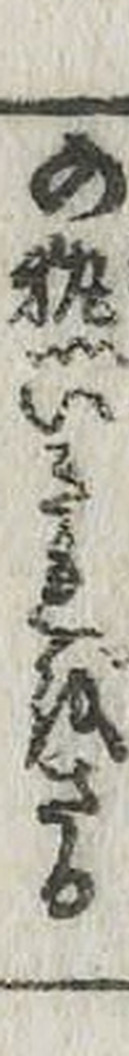の熱いきれをさる
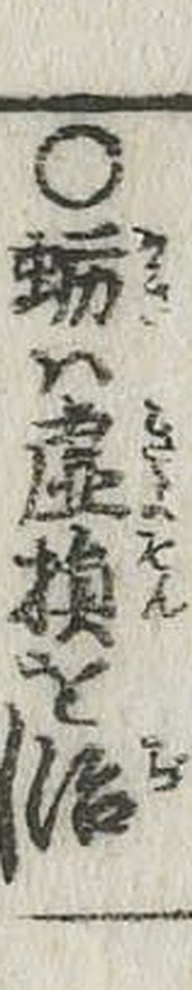○蛎は虚損を治し

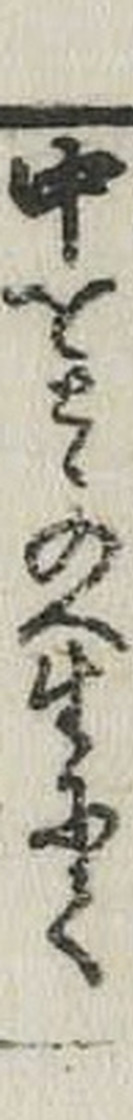中をとゝのへ生にて
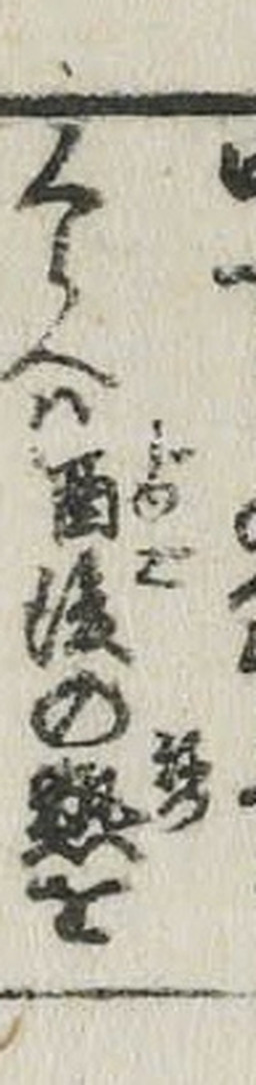くらへは酒後の熱を
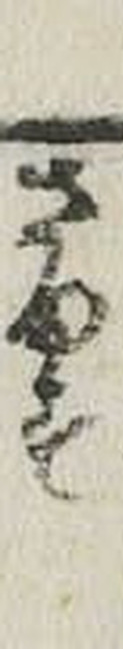さます
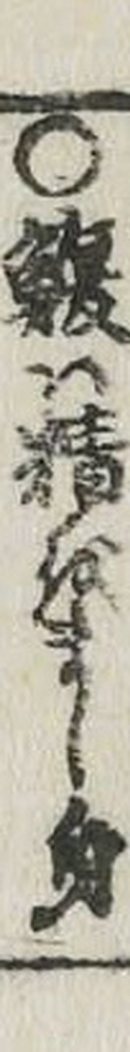○鰒は精をまし身
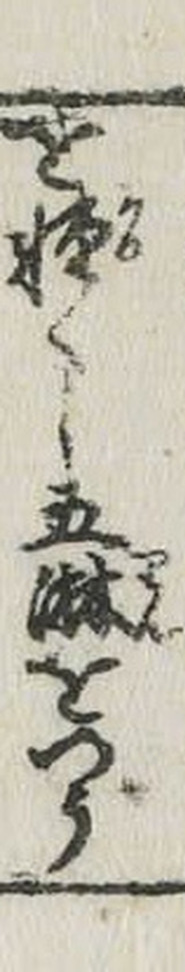を軽くし五淋をつう
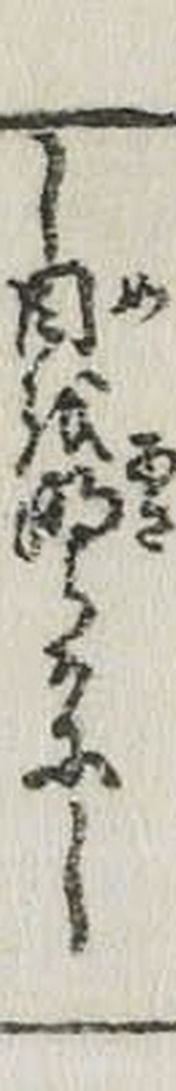し目を明らかにし
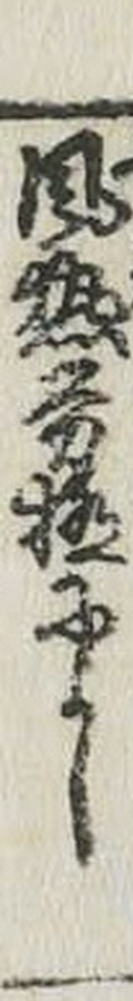風熱労極によし
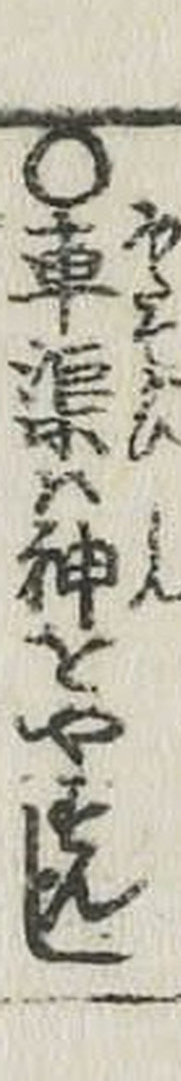○車渠は神をやすんじ
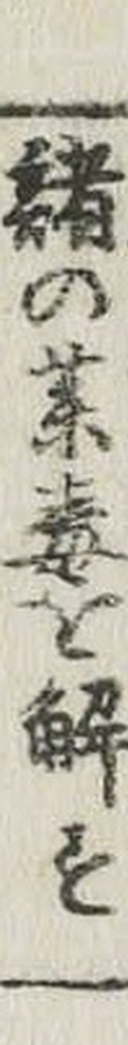諸の薬毒を解す
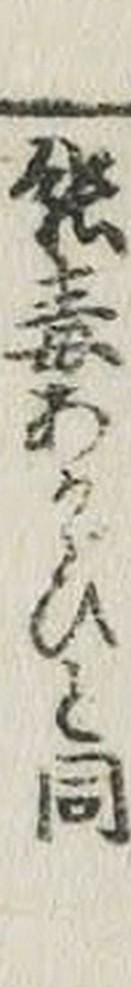能毒あかゞひと同
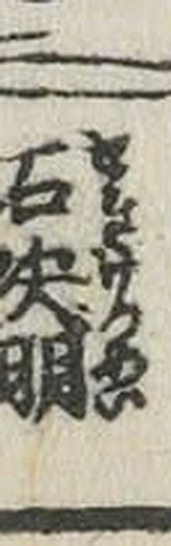石決明
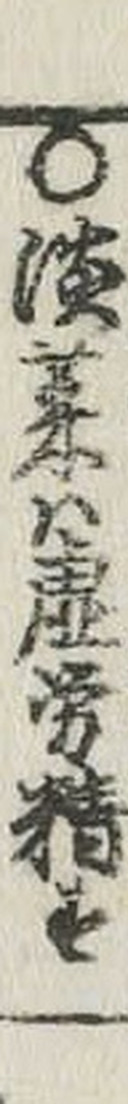○淡菜は虚労精す
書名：増補頭書訓蒙図彙大成 10巻 7:巻之14-16
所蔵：東京学芸大学教育コンテンツアーカイブ
